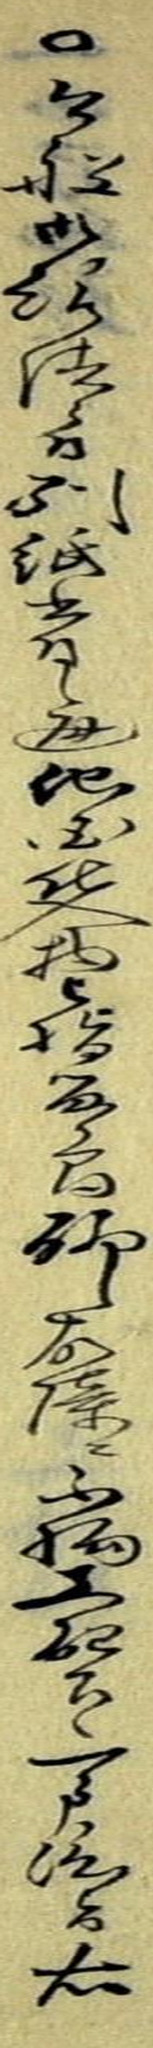○今般御趣法ニ付別紙書付之通他国貨物被指留候間聊故障ニ不拘支配下へ可申渡旨右
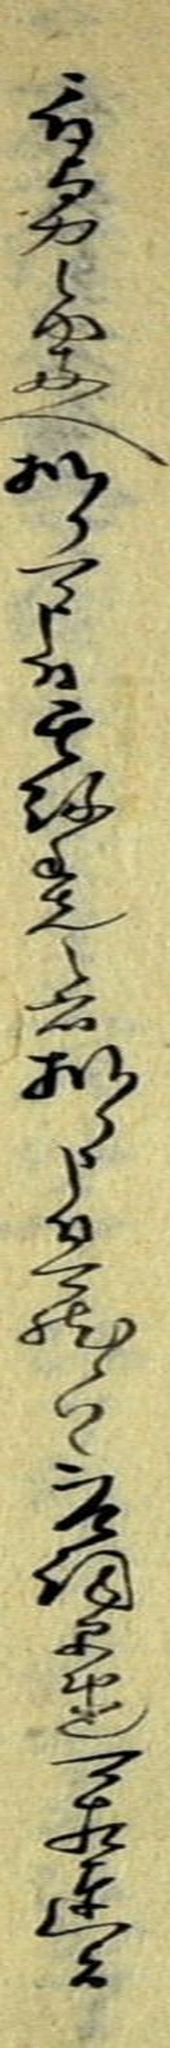ニ付与力之内両人掛り可申付其余手先之者掛り申付可然候ハヽ取調早速可相達旨

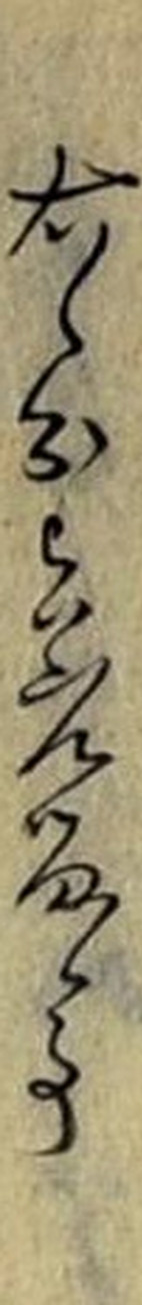右之分被差留候事
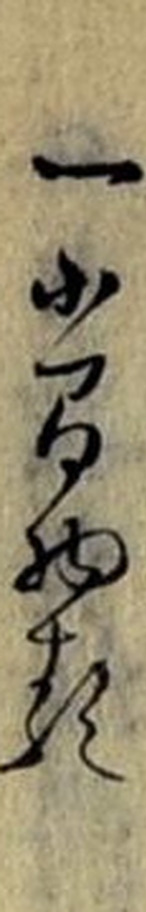一小間物類
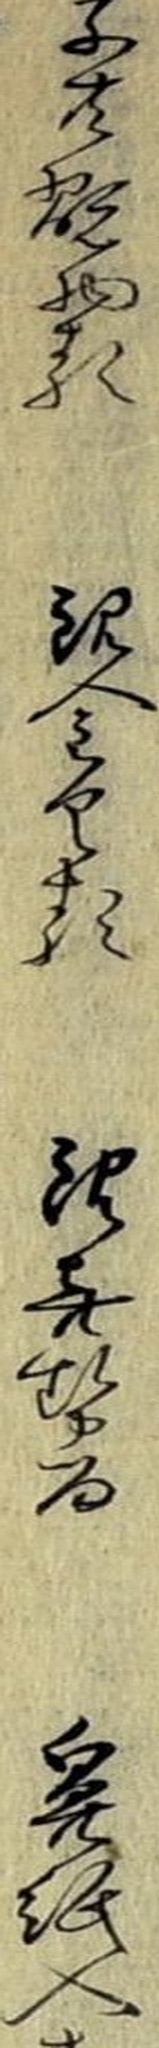子共翫物類銀金具類銀喜勢留鼻紙入類
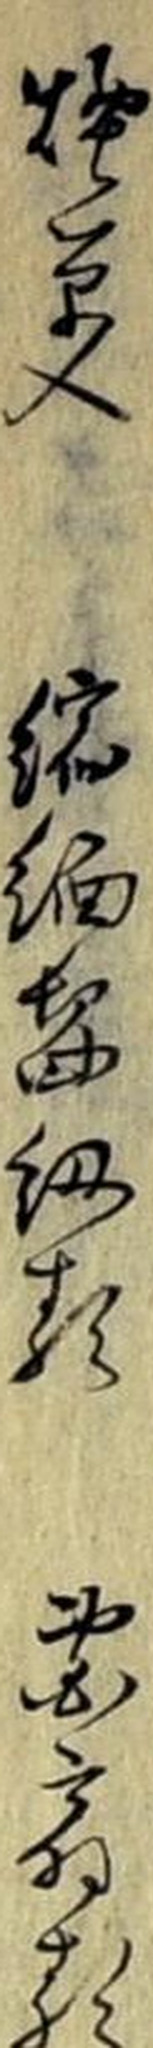煙草入縮緬髷紐類団扇類
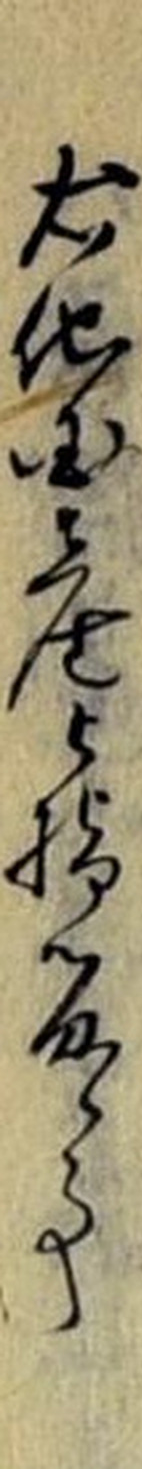右他国産被指留候事
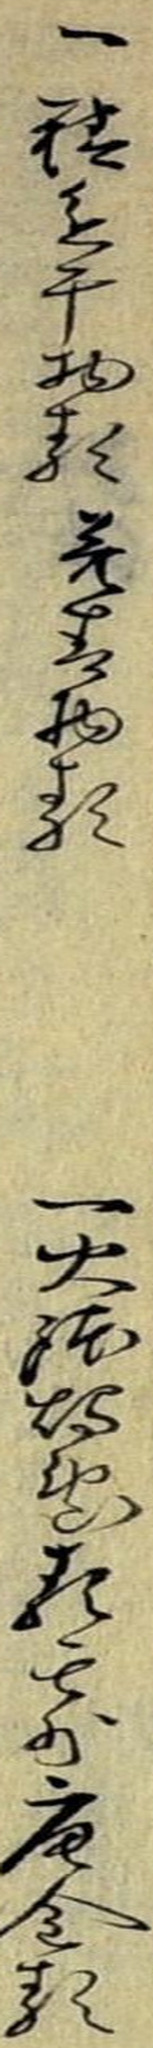一精進干物類并青物類一火鉢燭台類其外唐金類
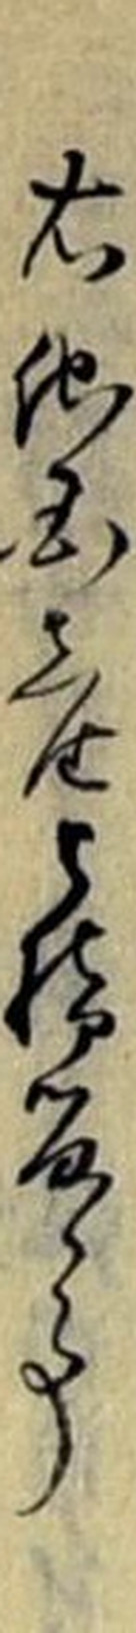右他国産被指留候事
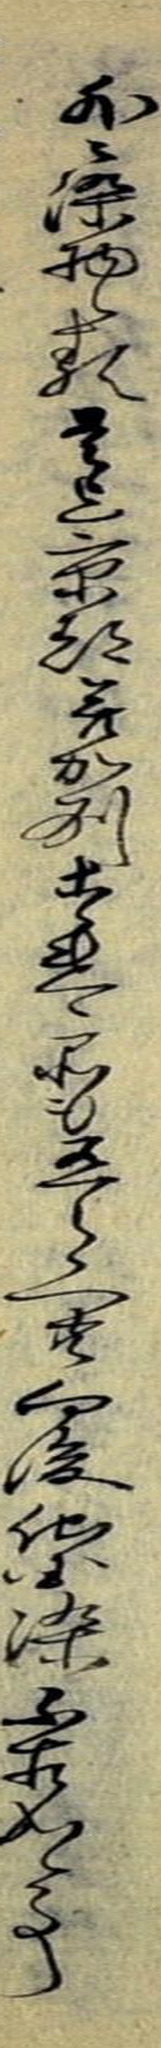外ニ染物之類是迄京都并加州等へ遣候品も有之候へ共向後他国染不相成候事
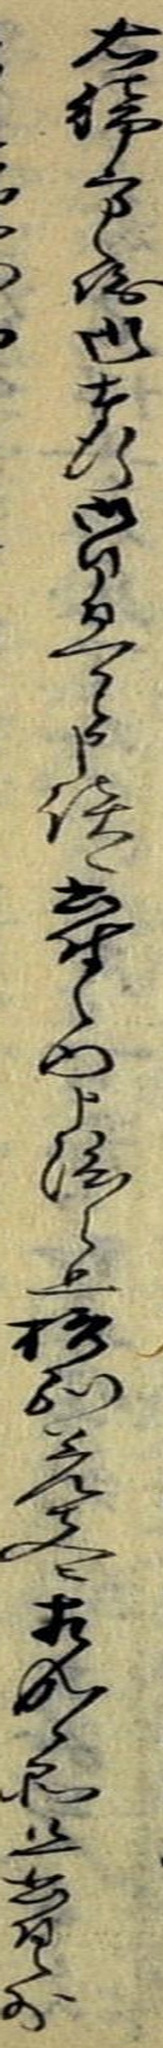右締方之儀御奉行御目付可被申談候書付之内申渡之上格別差支被相成候品且書付之外
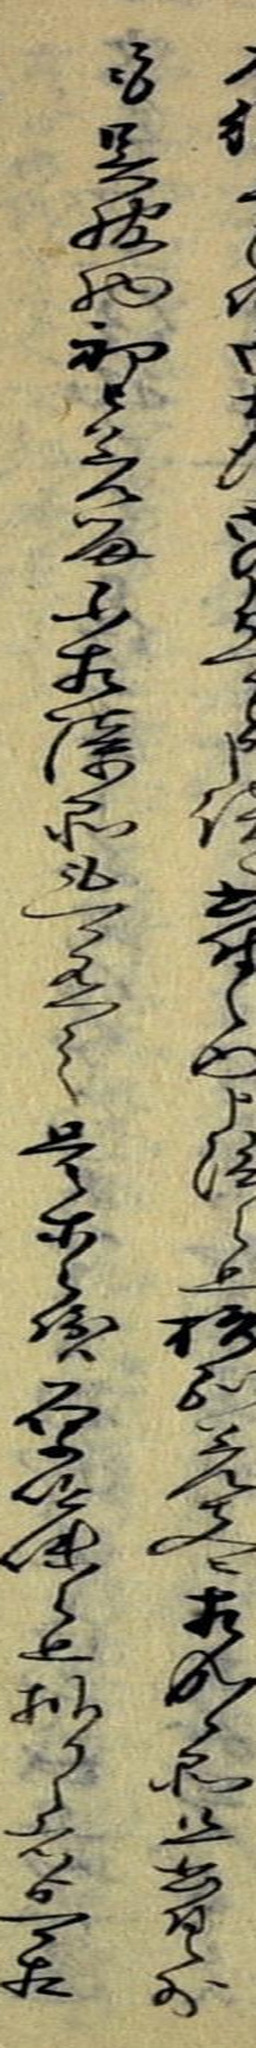ニも呉服物初被差留不相障品も可有之是等之儀ハ厚吟味之上掛り之物ゟ可相
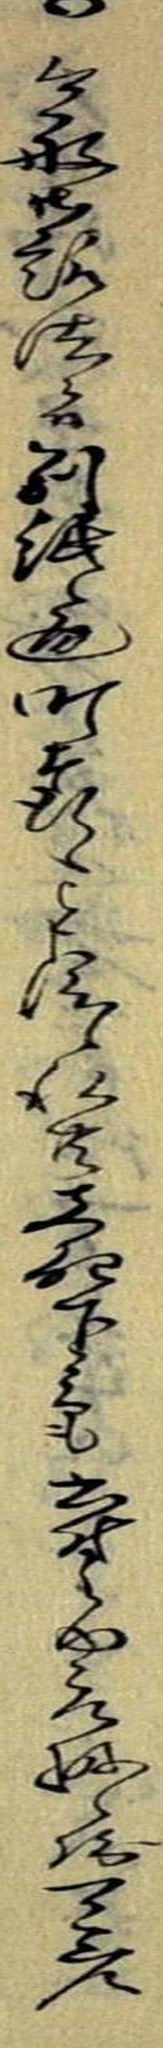○今般御趣法ニ付別紙之通町奉行へ被申渡候私共支配下ニ而も書付之内取扱候儀可差
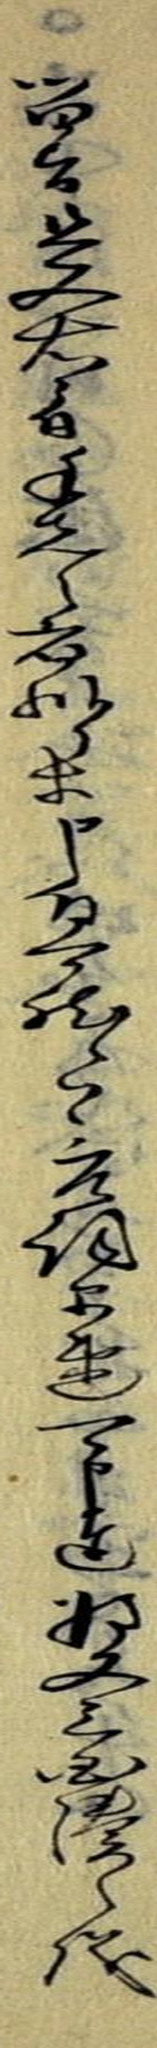留旨且又右ニ付手先之者掛り等申付可然候ハヽ取調早速可申達将又三国湊之儀
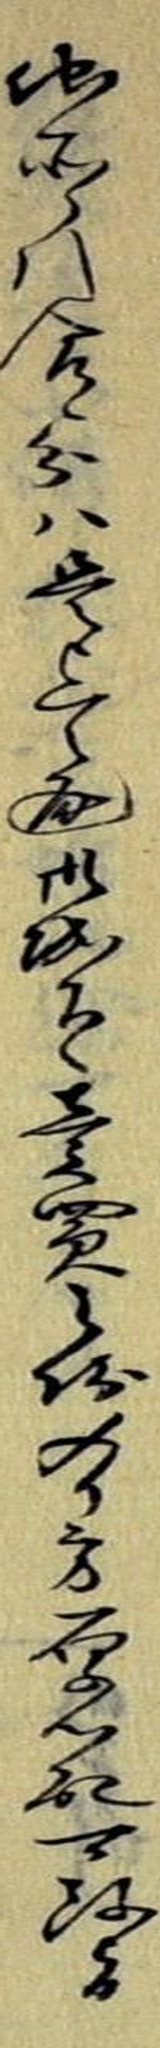他所之引合之分ハ是迄之通御城下へ売買之儀〆り方厚心配可致旨
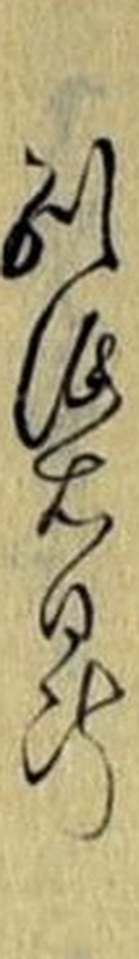別紙右同断
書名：命令之部 五
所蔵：福井県文書館 Fukui Prefectural Archives
